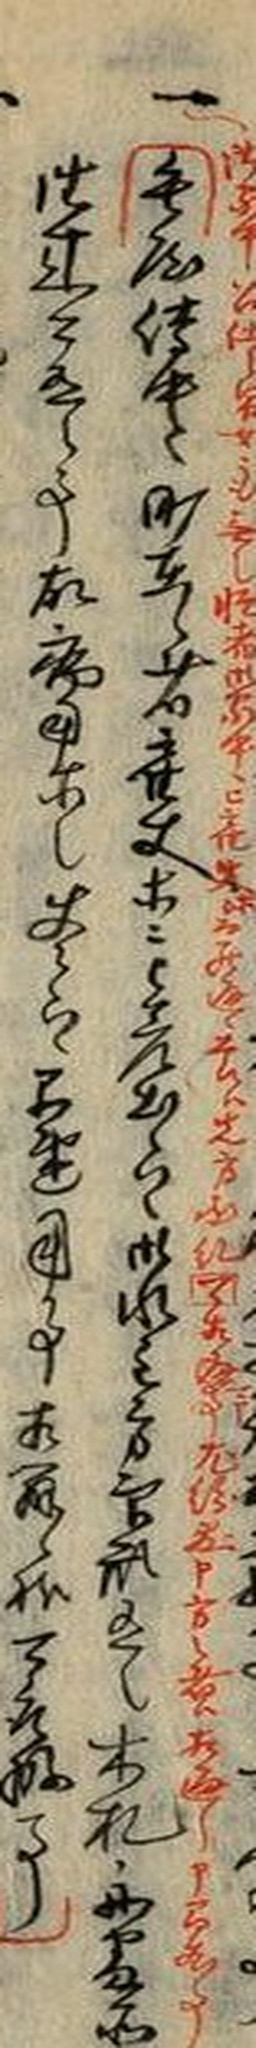往来可有之事故病用等之使に候はゝ早速用事相弁候様可取扱事
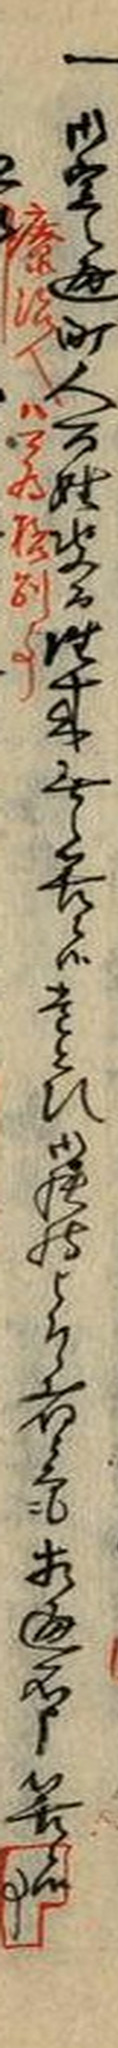一御定之通町人百姓決て往来無之筈に候たとひ御扶持被下候者にても相通不申筈に候事
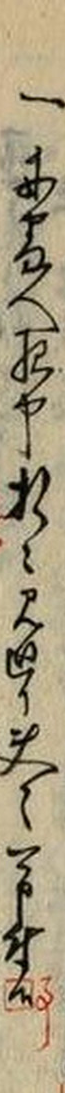一舟番人夜中折々見廻り夫々可申付候事
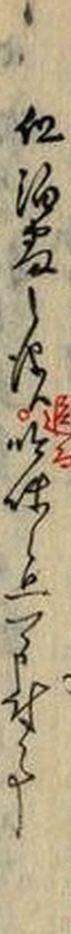但泊番之儀は◦追て吟味之上可申付事
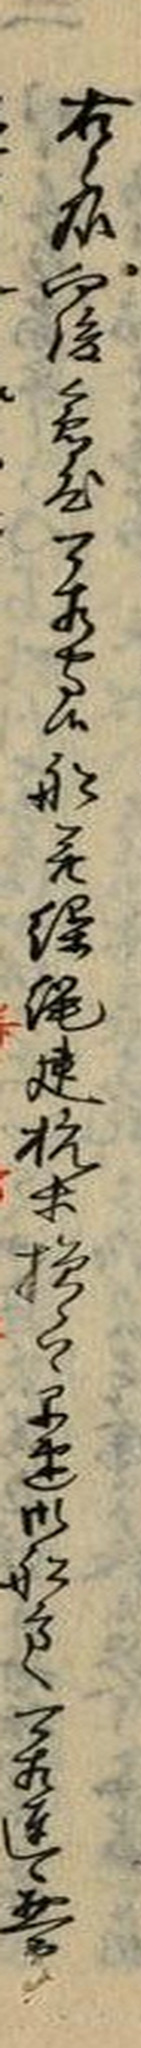右之趣向後急度可相守候船并繰縄建杭等損候はゝ早速御船方へ可相達候惣て
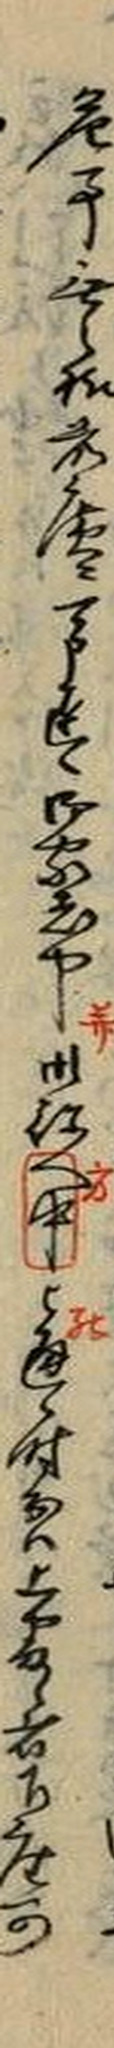危事無之様前広に可申達候御家老中并御役人中方被罷通候時分は上番之者下座可
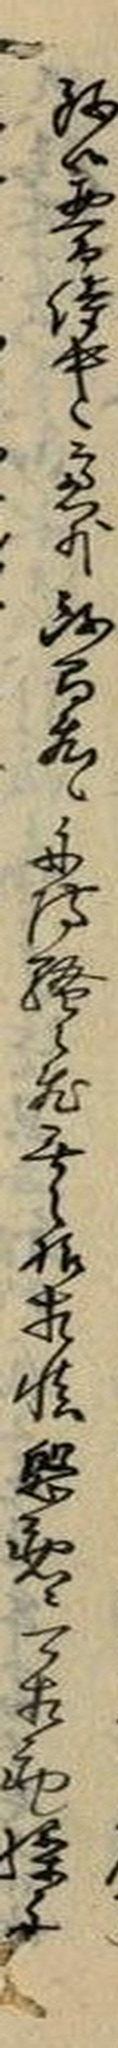致候惣て侍中へ慮外致間敷候舟場騒々敷無之様相慎慇懃に可相勤候繰舟
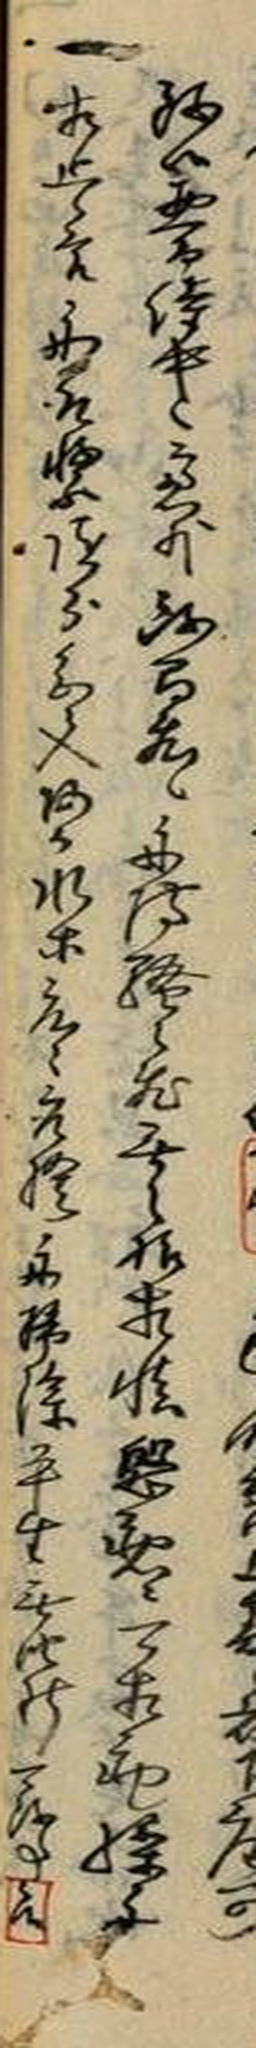相止候節舟取繋随分念ヲ入あか水等度々取捨舟掃除平生無油断可致事に候
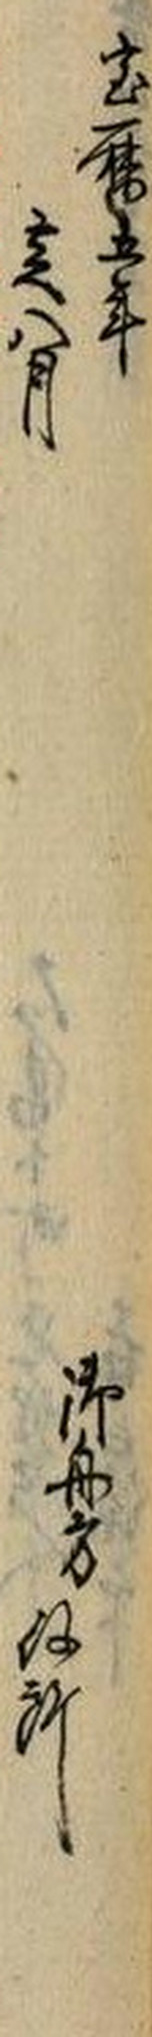宝暦五年御舟方役所
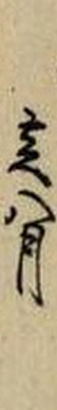亥八月
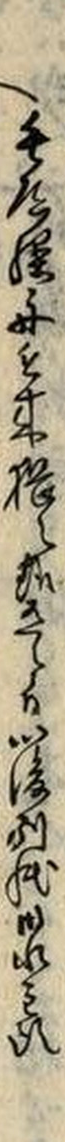毛屋繰舟近来猥之趣有之に付以後別紙御水主頭
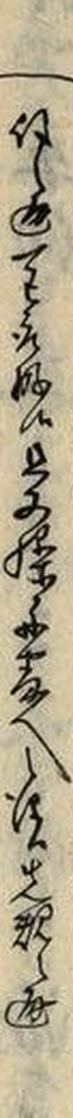伺之通可被取扱候且又繰舟番人之儀は先規之通
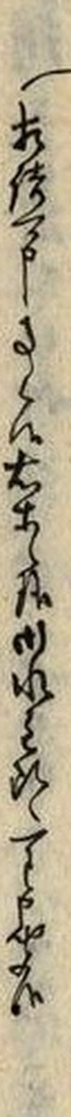相詰可申事に候右等之趣御水主頭へ可被申聞候
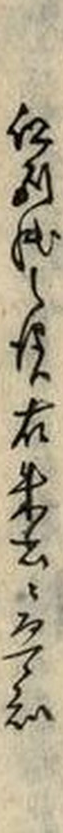但別紙之儀は右朱書にて可知
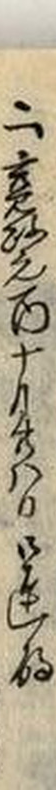一寛政元酉十月廿八日口達触
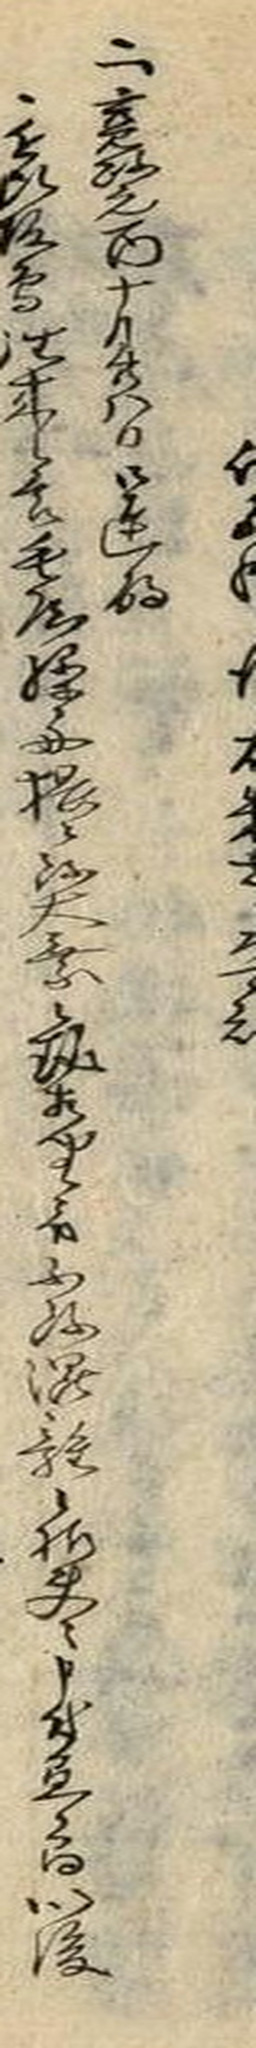・近頃坂鳥往来之節毛屋繰舟猥に致大乗候趣相聞候に付不致混雑候様夫々申付置候間以後
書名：御城下諸事之部
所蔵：福井県文書館 Fukui Prefectural Archives
